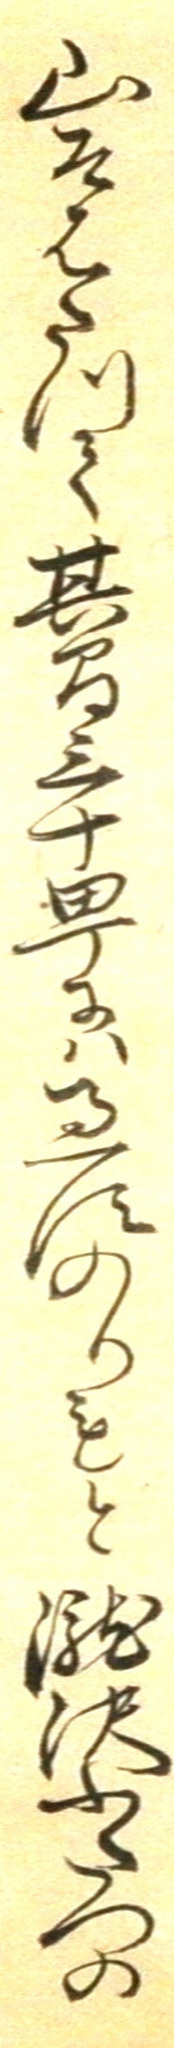山そはたつて其間三十町には過すのりもと瀧沢ふたつの
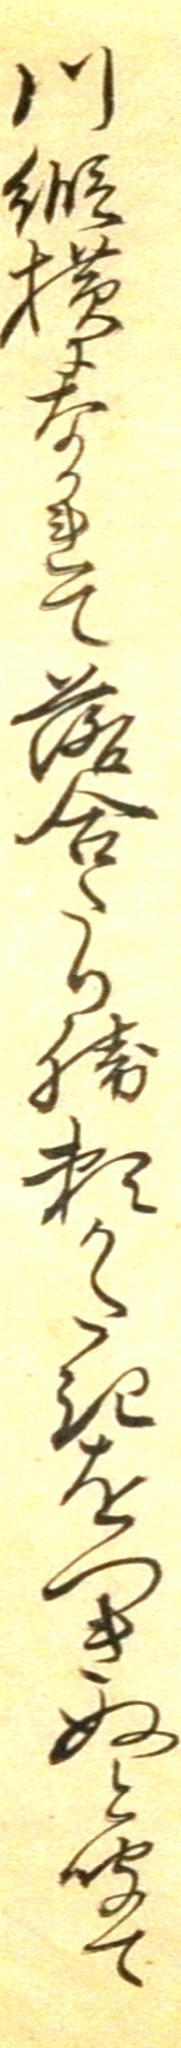川縦横になかれて落合たり勝頼かたきをつきぬと聞て
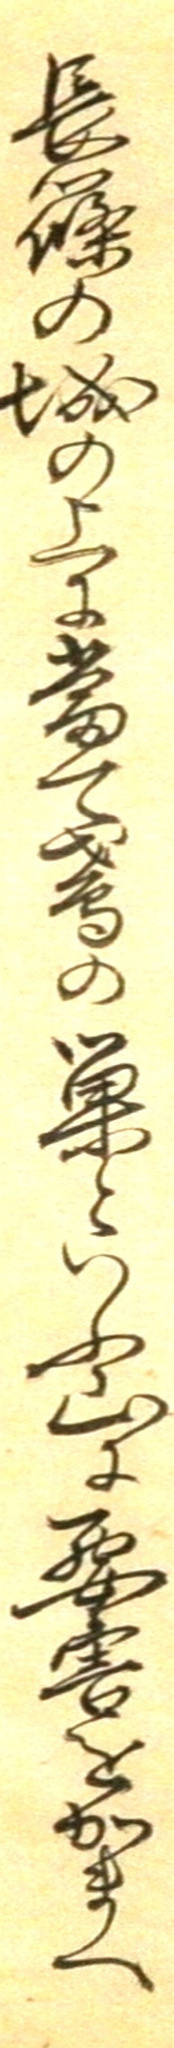長篠の城の上に当て鳶の巣といふ山に要害をかまへ
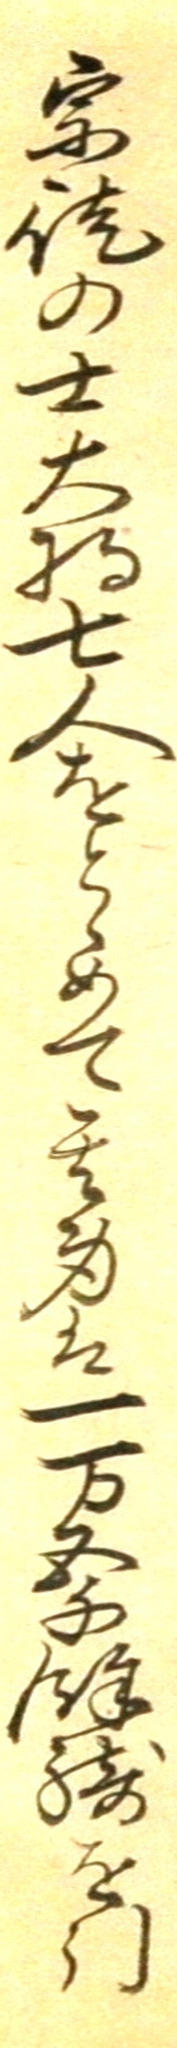宗徒の士大将七人をとゝめて其身は一万五千余騎を引
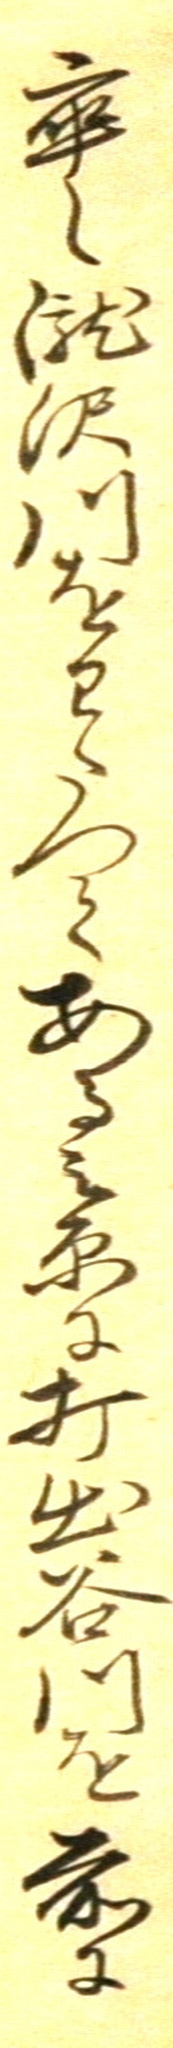卒し瀧沢川をわたつてあるみ原に打出谷川を前に

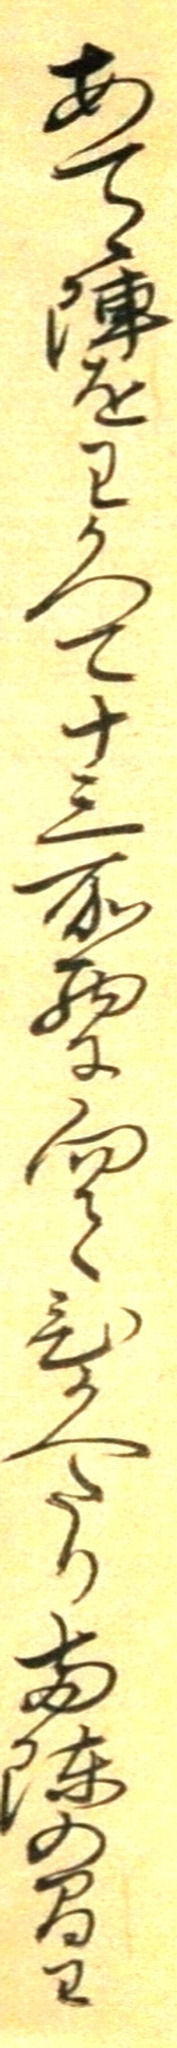あてゝ陣をわかつて十三所西に向てひかへたり両陣の間わ
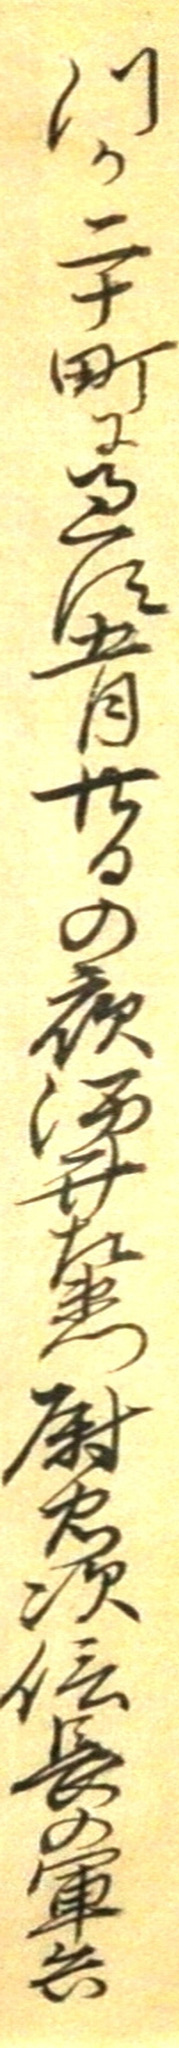つか二十町に過す五月廿日の夜酒井左衛門尉忠次信長の軍兵
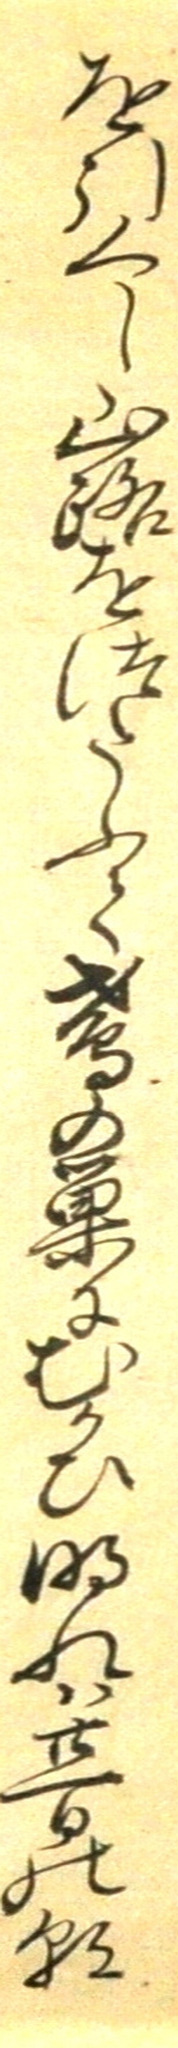を引くし山路をつたふて鳶の巣にむかひ明れは廿一日の朝
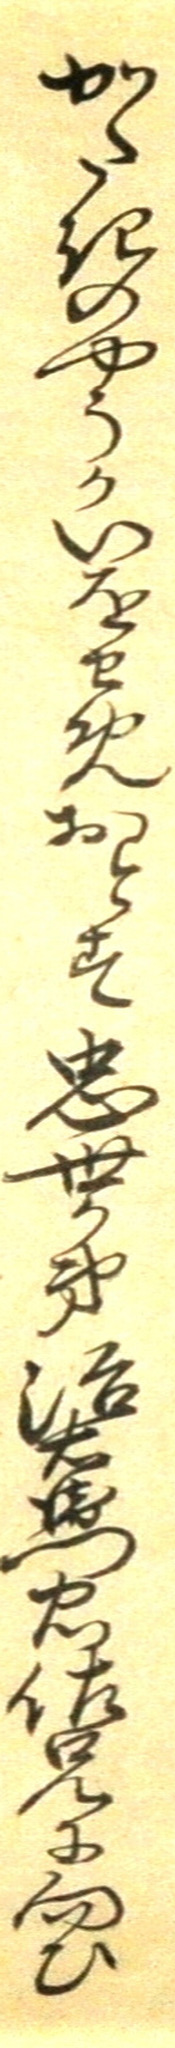かたきのやうかいをせめおとす忠世か弟治右衛門忠佐兄に向ひ
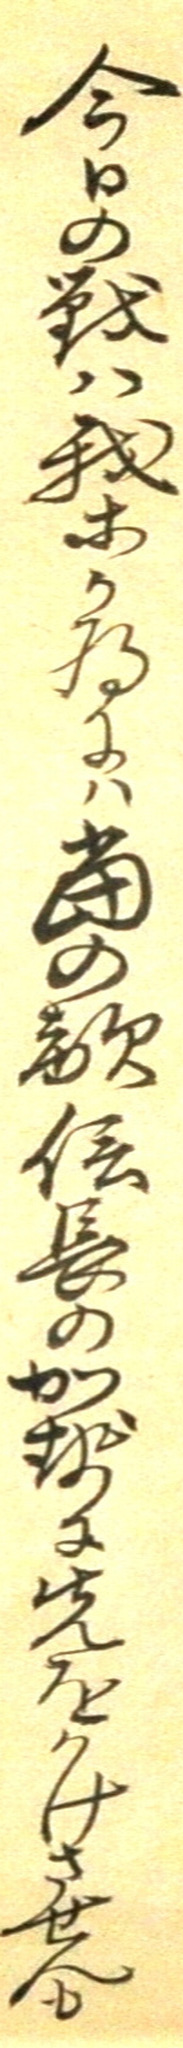今日の戦は我等か為には当の敵信長の加勢に先をかけさせんも
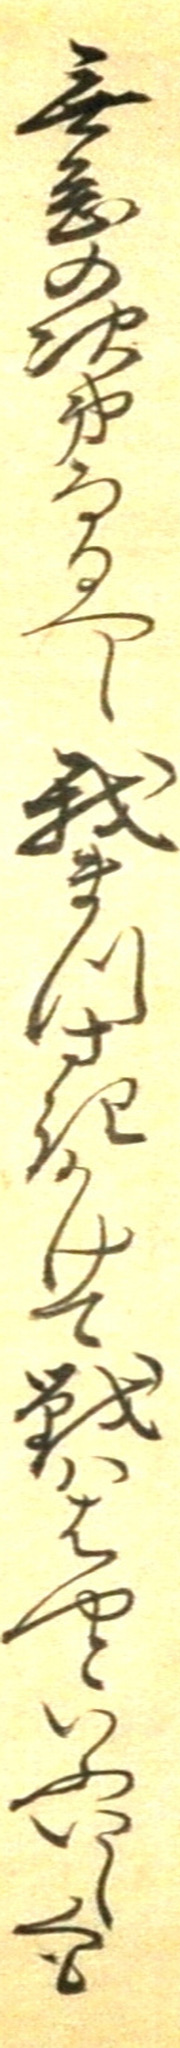無念の次第なるへし我まつさきかけて戦ははやといふいしくも
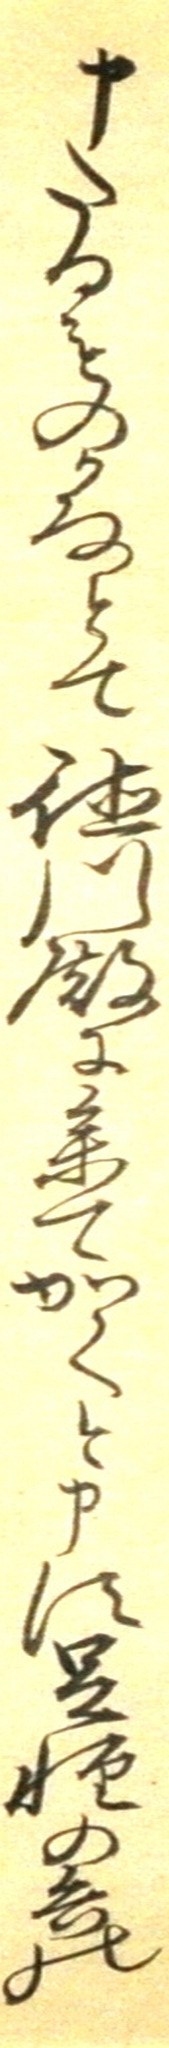申たるものかなとて徳川殿に参てかくと申す足軽の兵の
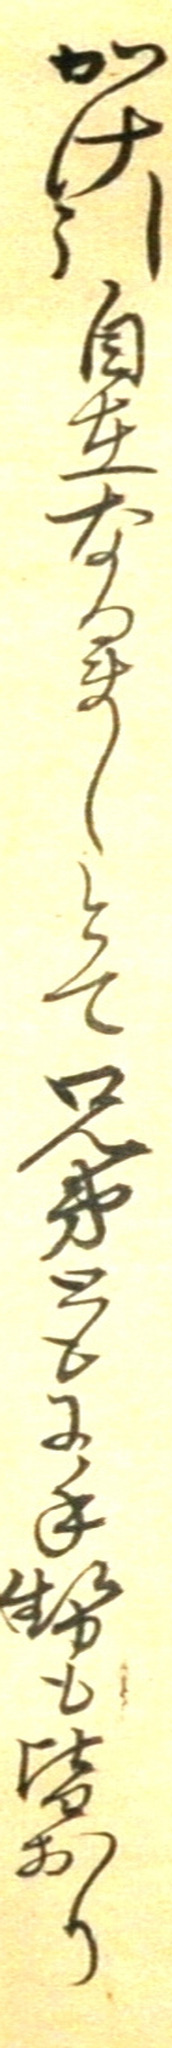かけ引自在なるましとて兄弟ともに手勢も皆おり
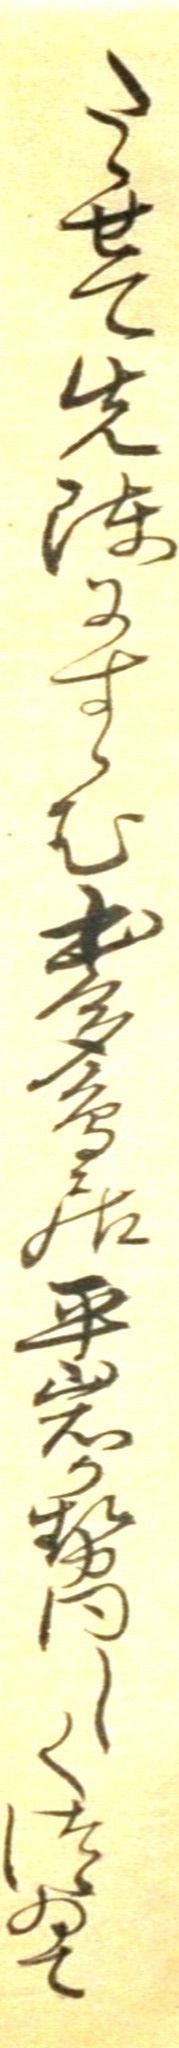たゝせて先陣にすゝむ本多鳥居平岩か勢同しくつゝゐて
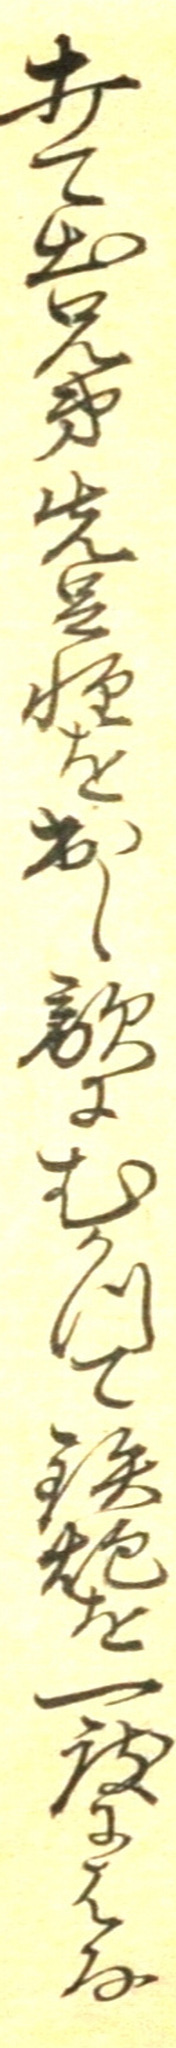打て出兄弟先足軽を出し敵にむかつて鉄炮を一度にはな
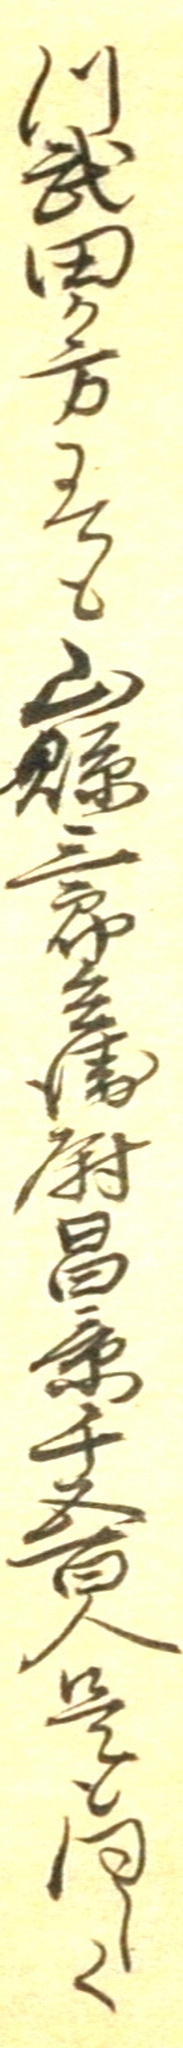つ武田か方にても山縣三郎兵衛尉昌景千五百人是も同しく
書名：藩翰譜（四・中）
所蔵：伊那市立高遠町図書館・合同会社AMANE
